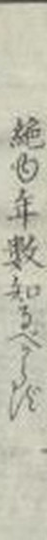絶ゆ年数知るべからず
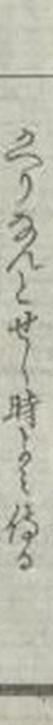かへりなんとせし時よみ侍る
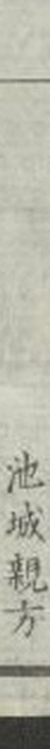池城親方
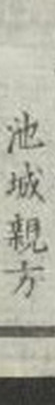池城親方
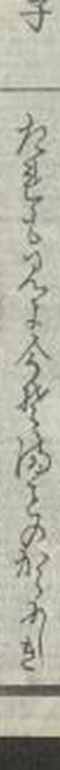たれも見よ今そまことのからにしき
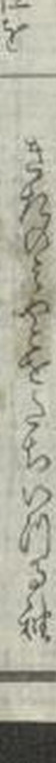きたのみやこをたちいつる袖
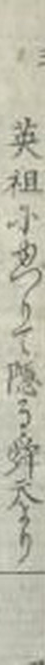英祖にゆづりて隠る舜天より
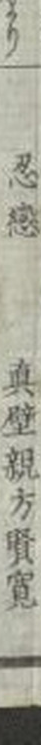忍恋真壁親方賢寛
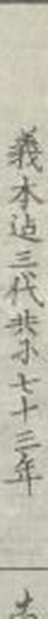義本迠三代共に七十三年
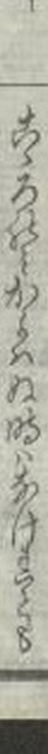こゝろのみかよはぬ時はなけれとも
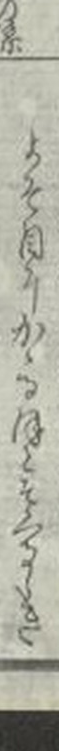よそ目にかゝる月とそくるしき
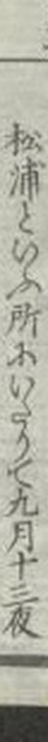松浦といふ所にいたりて九月十三夜
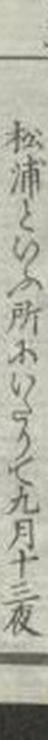松浦といふ所にいたりて九月十三夜
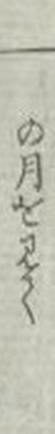の月を見て
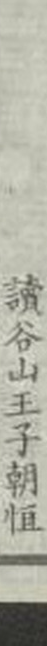読谷山王子朝恒
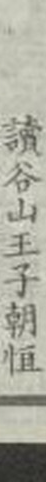読谷山王子朝恒
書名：中山国使略
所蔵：University of the Ryukyus Library
